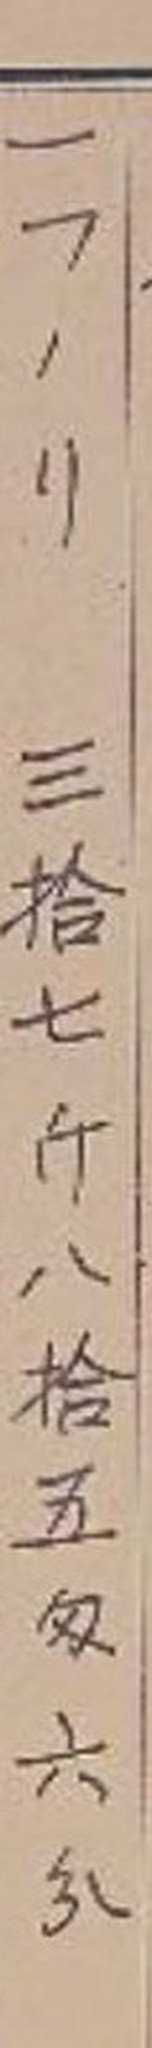一ふのり三拾七斤八拾五匁六分
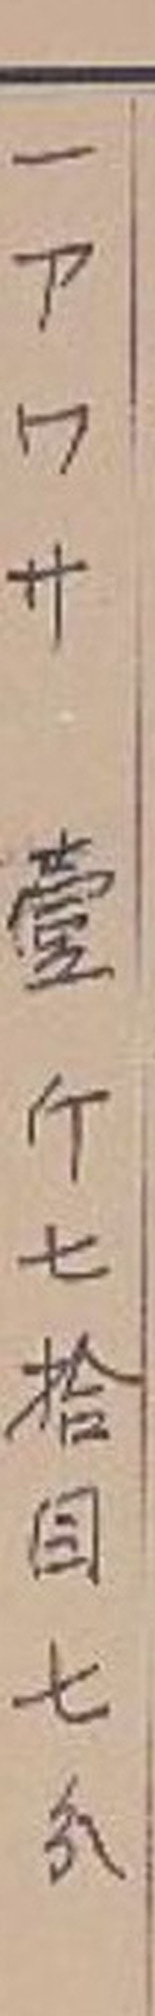一あわさ壱斤七拾目七分
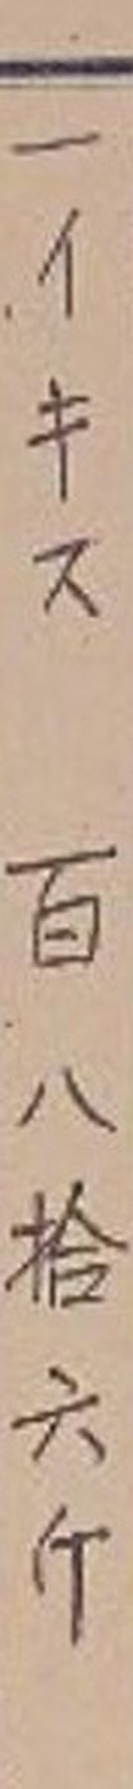一いきす百八拾六斤
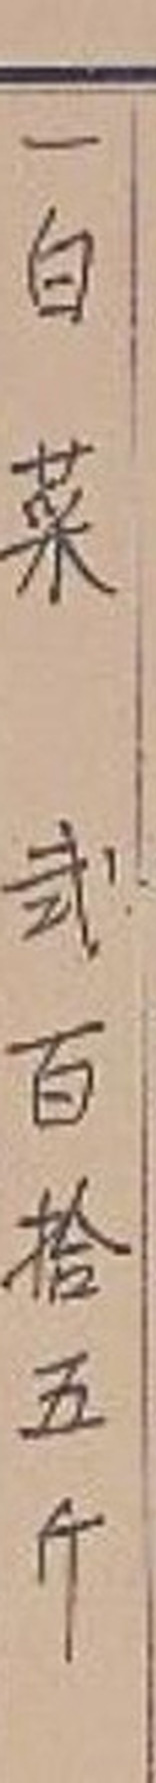一白菜弐百拾五斤
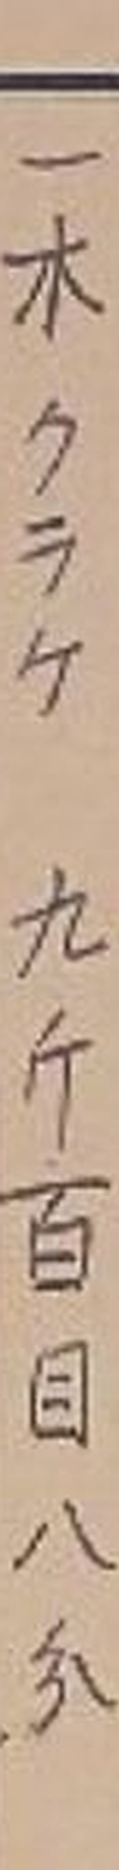一木くらけ九斤百目八分
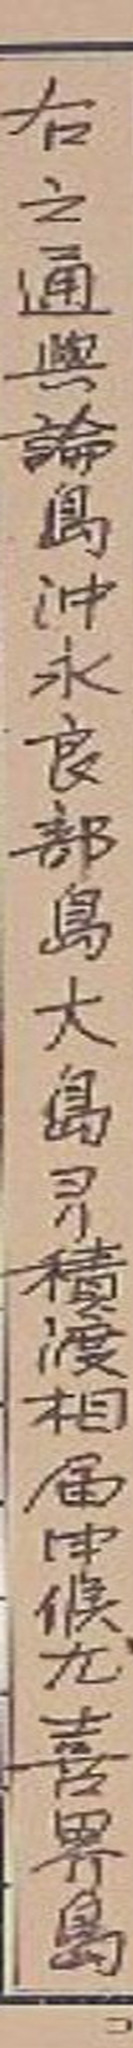右之通与論島沖永良部島大島より積渡相届申候尤喜界島
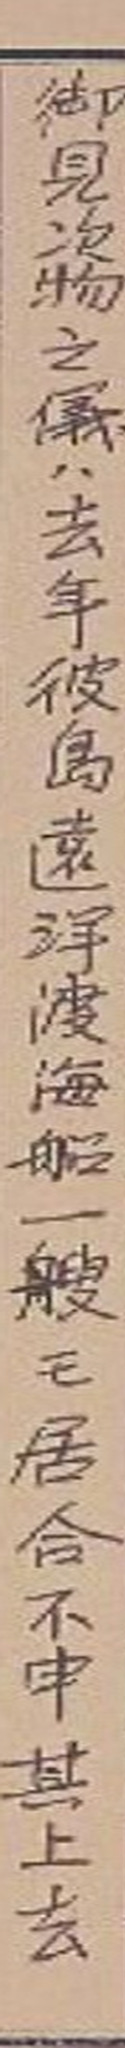御見次物之儀は去年彼島遠洋渡海船一艘も居合不申其上去
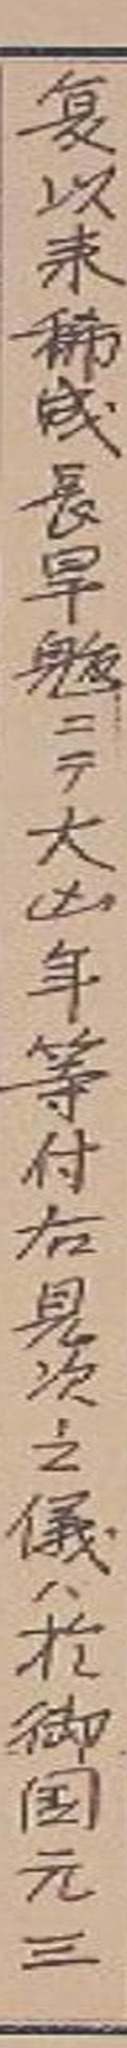夏以来稀成長旱魃にて大凶年等付右見次之儀は於御国元三
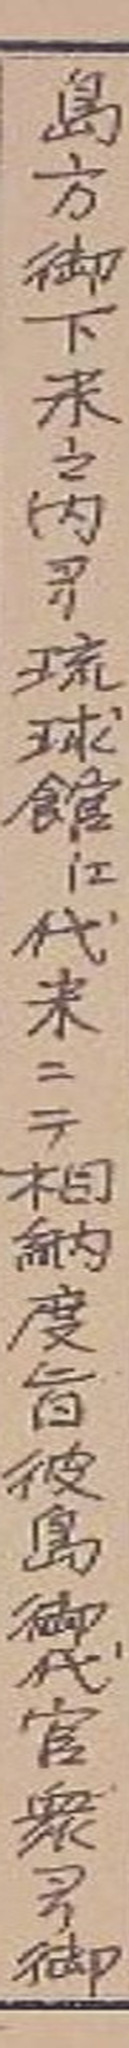島方御下米之内より琉球館え代米にて相納度旨彼島御代官衆より御
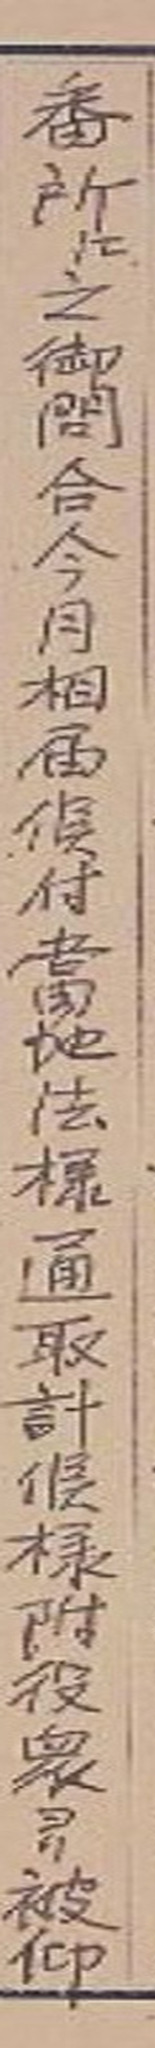番所え之御問合今月相届候付当地法様通取計候様附役衆より被仰
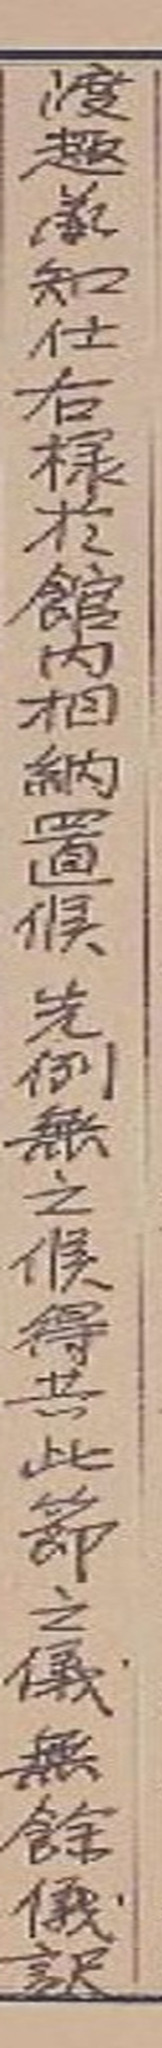渡趣承知仕右様於館内相納置候先例無之候得共此節之儀無余儀訳
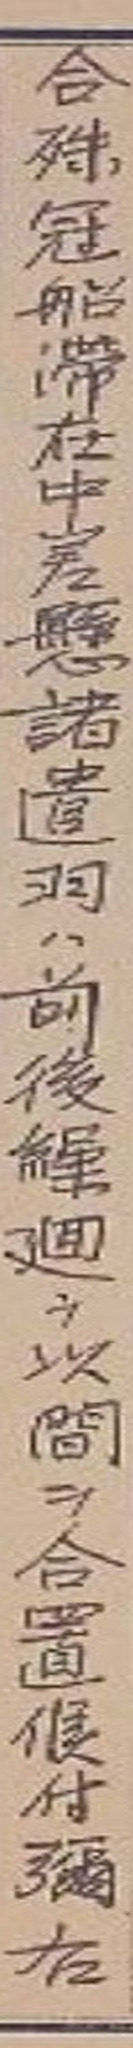合殊冠船滞在中差懸諸遣羽は前後繰廻を以間を合置候付弥右
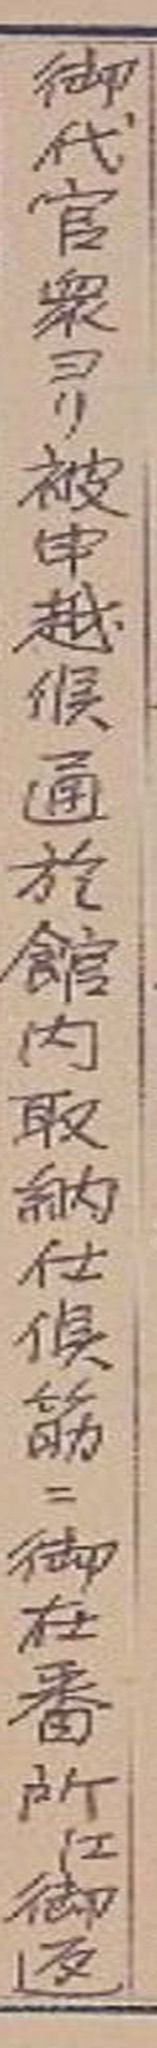御代官衆より被申越候通於館内取納仕候筋に御在番所え御返
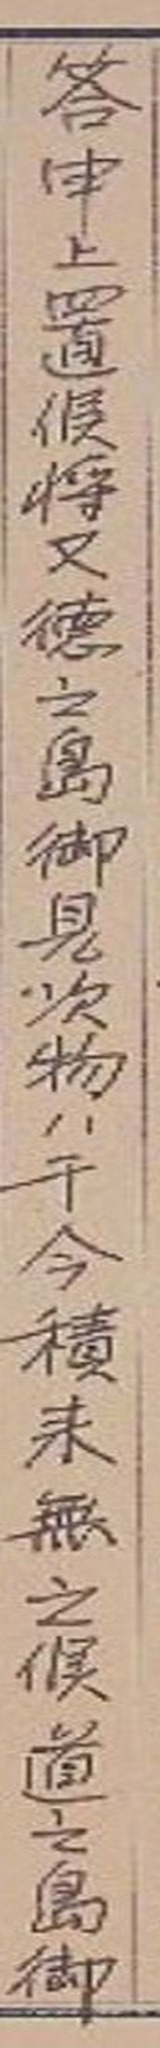答申上置候将又徳之島御見次物は于今積来無之候道之島御
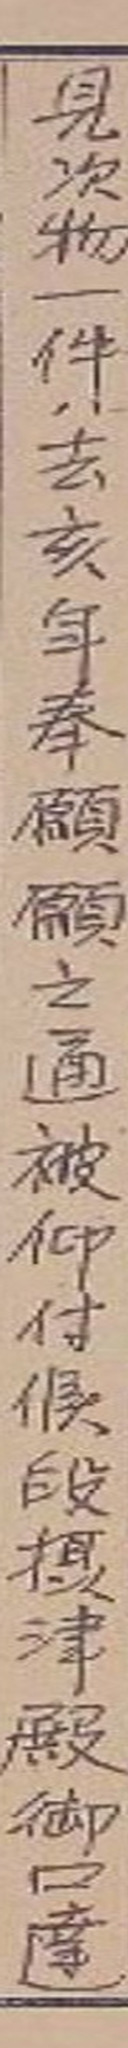見次物一件は去亥年奉願願之通被仰付候段摂津殿御口達
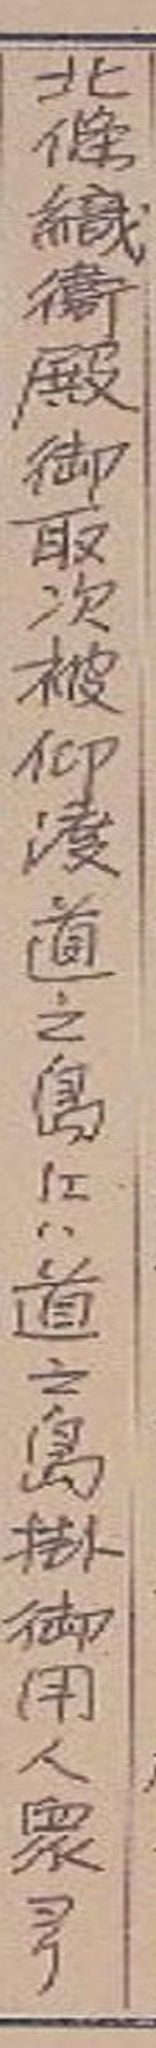北条織衛殿御取次被仰渡道之島えは道之島掛御用人衆より
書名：支那冊封使来琉諸記 下巻
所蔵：University of the Ryukyus Library
